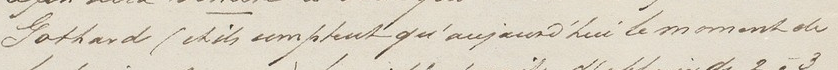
Gothard (et ils comptent qu'aujourd'hui le moment de
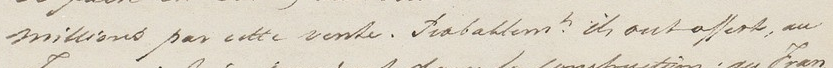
millions par cette vente. Probablemt ils ont offert, au
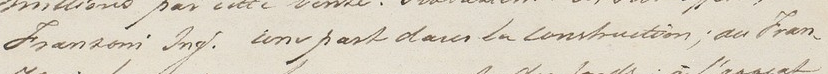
Franzoni Ingrune part dans la construction; au Fran-
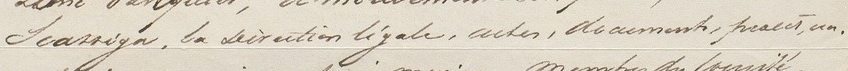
Scazziga, la Direction légale, actes documents, procès, ...
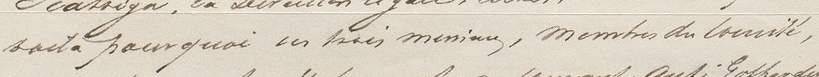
voila pourquoi ces trois Messieurs, Membres du Comité,
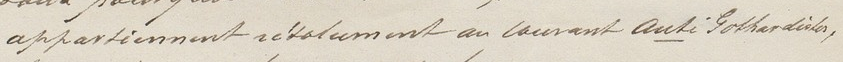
appartiennent résolument au courant Anti-Gothardistes,
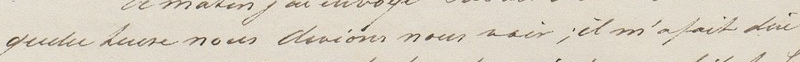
quelle heure nous devions nous voir; il m'a fait dire
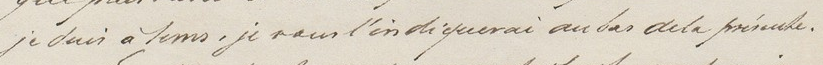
je suis à tems, je vous l'indiquerai au bas dela préscrite.
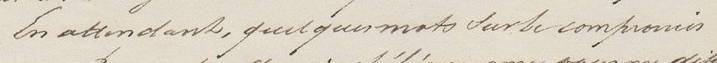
En attendant, quelques mots sur le compromis
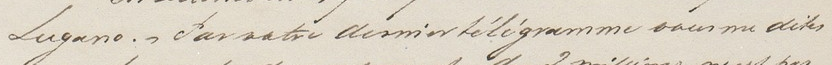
Lugano. – Par votre dernier télégramme vous me dites
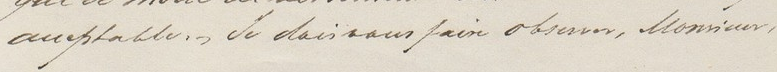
acceptable. – Je dois vous faire observer, Monsieur,
